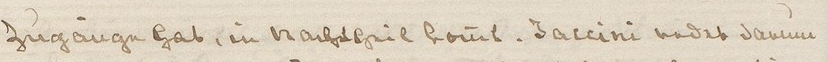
Zugänge hat, in Nachtheil kommt. Jaccini redet darum
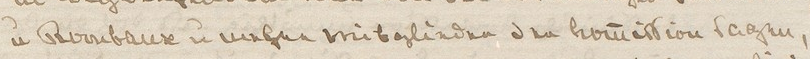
u Rombaux u mehre Mitglieder der Kommission sagen,
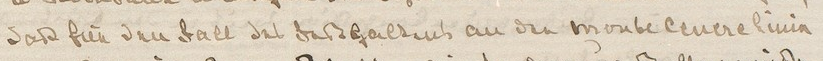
daß für den Fall des Festhaltens an des Monte Cenere Linie
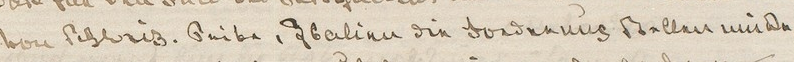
von Schweiz. Seite, Italien die Forderung stellen müße,
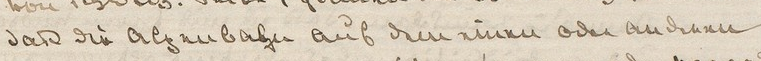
daß die Alpenbahn auf dem einen oder anderen
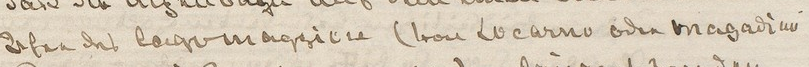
Ufer des Lagomaggiore (von Locarno oder Magadino
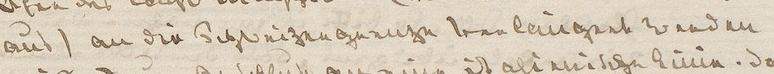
aus) an die Schweizergrenze verlängert werden
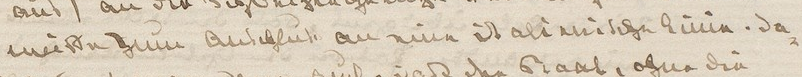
müße zum Anschluß an eine italienische Linie. Da -
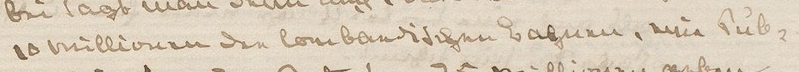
10 Millionen der lombardischen Bahnen, eine Sub-
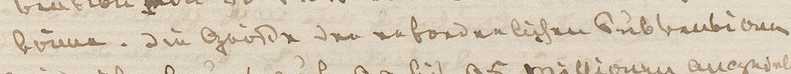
könne. Die Größe der erforderlichen Subventionen
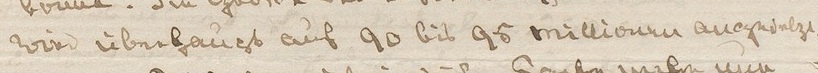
wird überhaupt auf 90 bis 95 Millionen angesetzt.
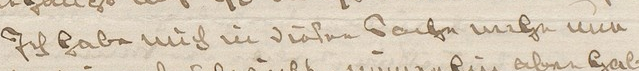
Ich habe mich in dieser Sache mehr nur
